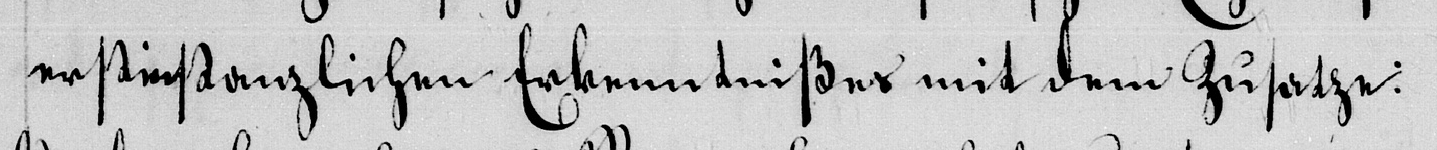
erstinstanzlichen Erkenntnißes mit dem Zusatze:
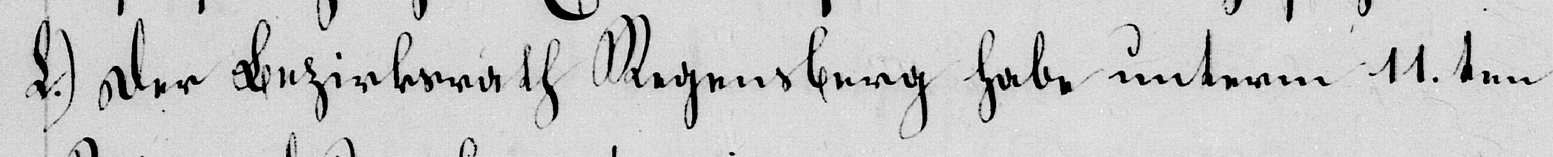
L.) Der Bezirksrath Regensberg habe unterm 11.ten
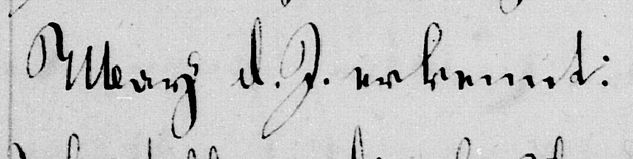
May d. J. erkennt:
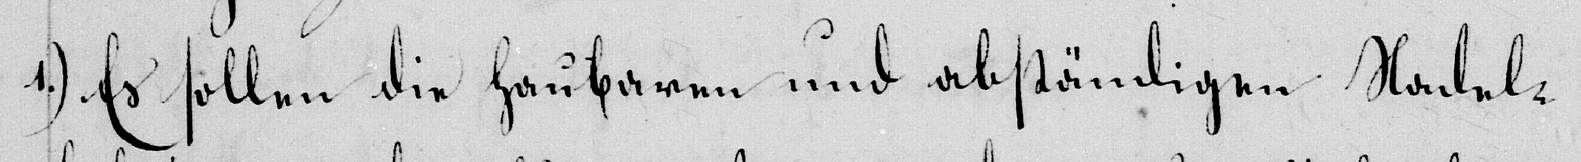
1.) Es sollen die haubaren und abständigen Nadel¬
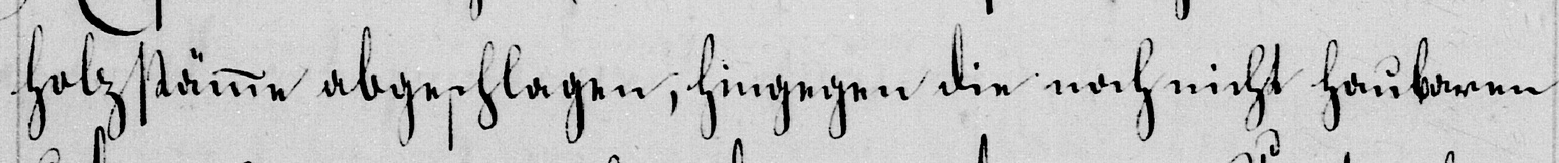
holzstämme abgeschlagen, hingegen die noch nicht haubaren
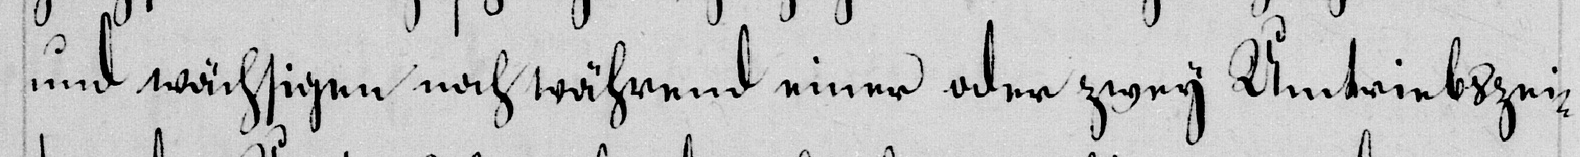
und wächsigen noch während einer oder zwey Umtriebszei¬
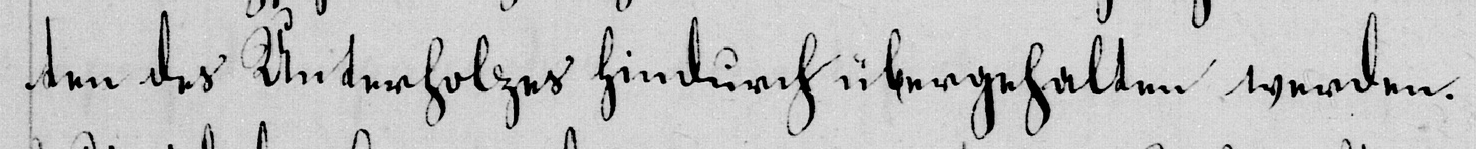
ten des Unterholzes hindurch übergehalten werden.
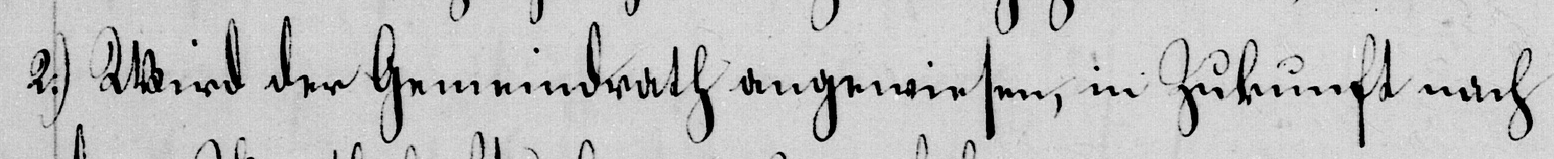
2.) Wird der Gemeindrath angewiesen, in Zukunft nach
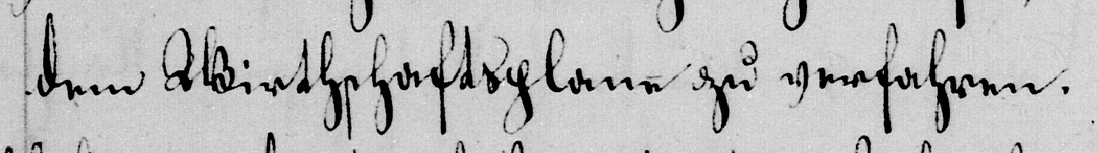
dem Wirthschaftsplane zu verfahren.
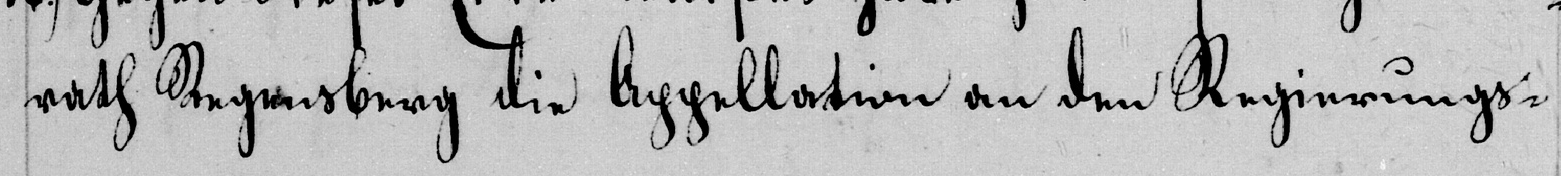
rath Regensberg die Appellation an den Regierungs-
